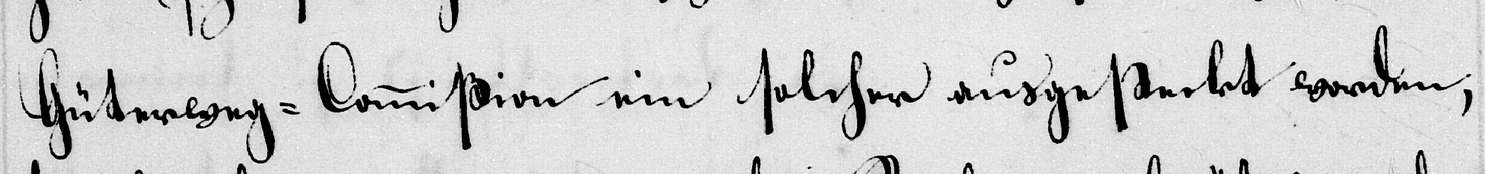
Güterweg-Commißion ein solcher ausgesteckt worden,
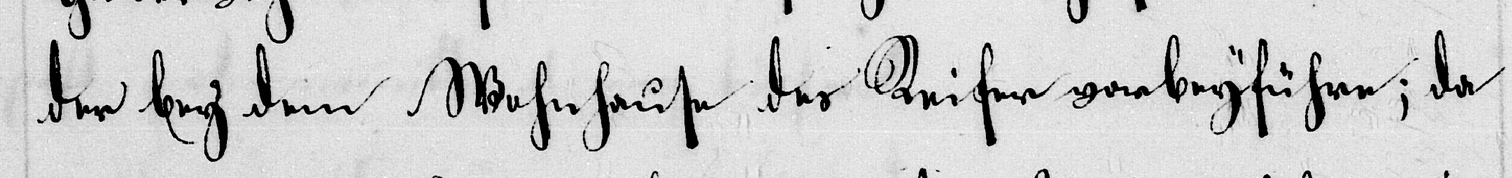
der bey dem Wohnhause des Reifer vorbeyführe; da
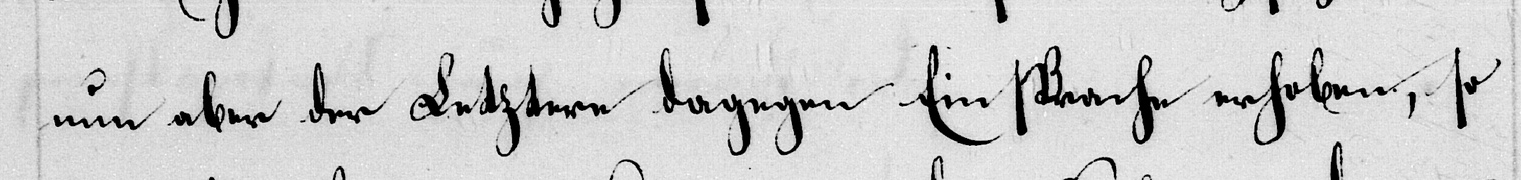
nun aber der Letztere dagegen Einsprache erhoben, so
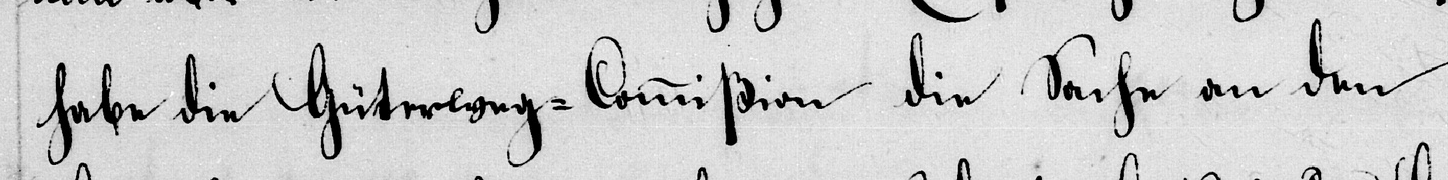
habe die Güterweg-Commißion die Sache an den
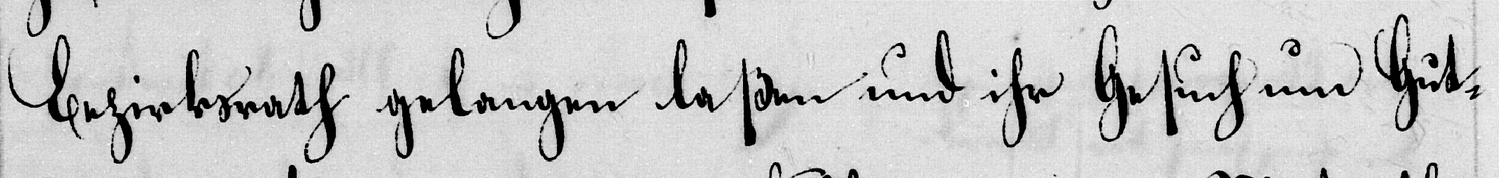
Bezirksrath gelangen laßen und ihr Gesuch um Gut¬
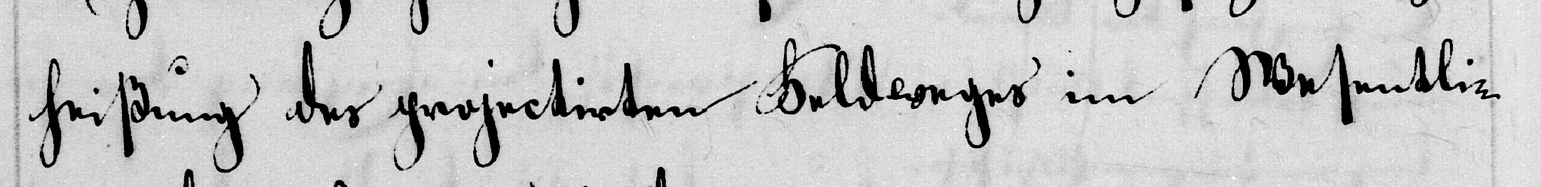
heißung des projectirten Feldweges im Wesentli¬
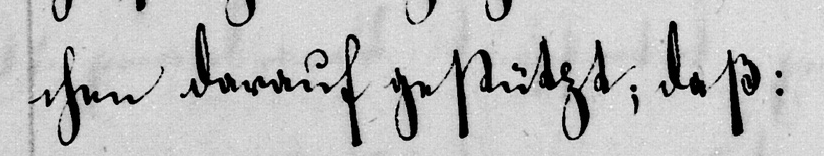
chen darauf gestützt, daß:
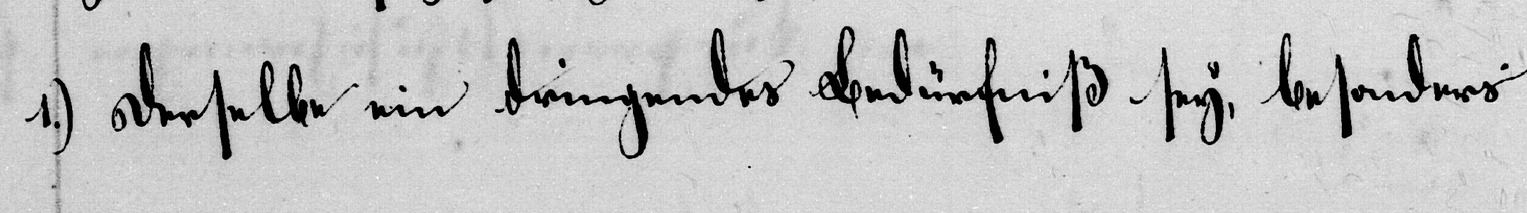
1.) Derselbe ein dringendes Bedürfniß sey, besonders
